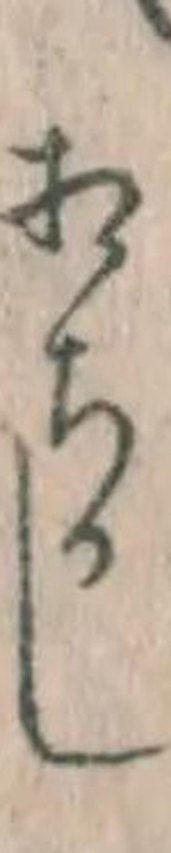相ちかし
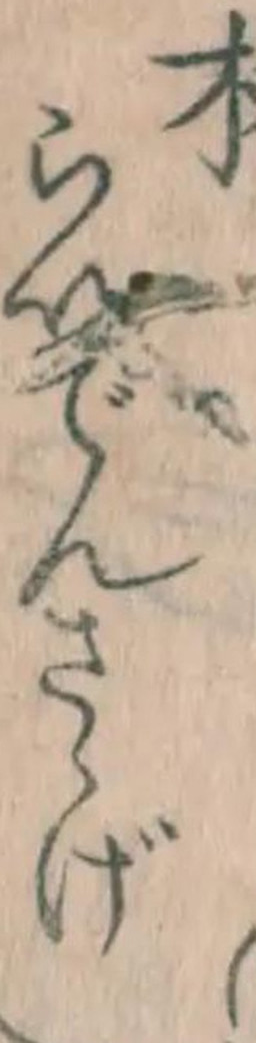らいでんさゝげ

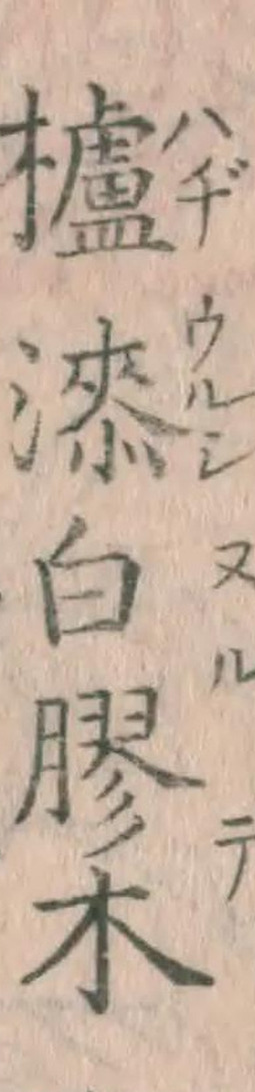櫨漆白膠木
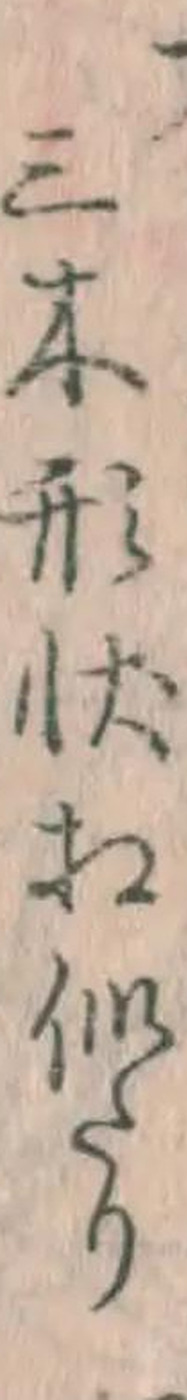三木形状相似たり
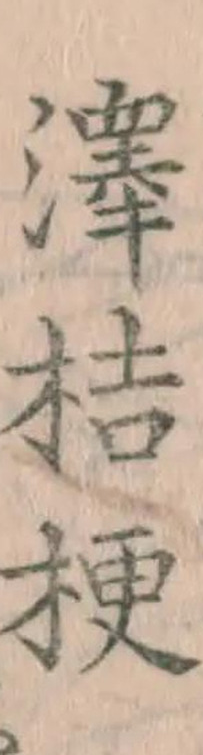沢桔梗
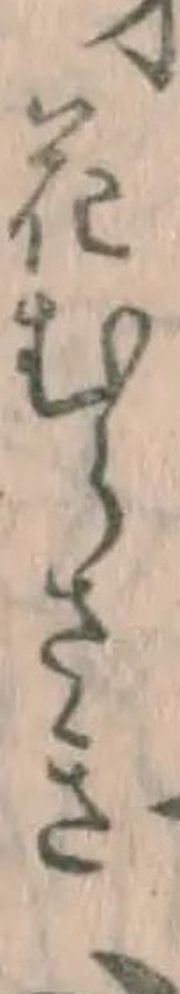花むらさき
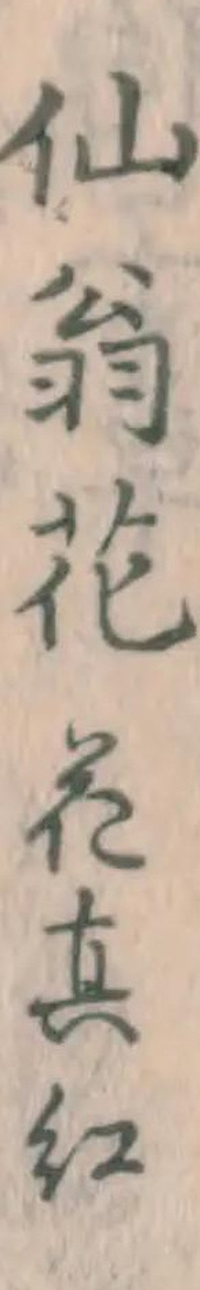仙翁花花真紅
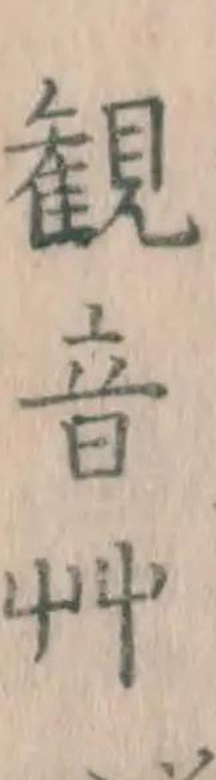観音草

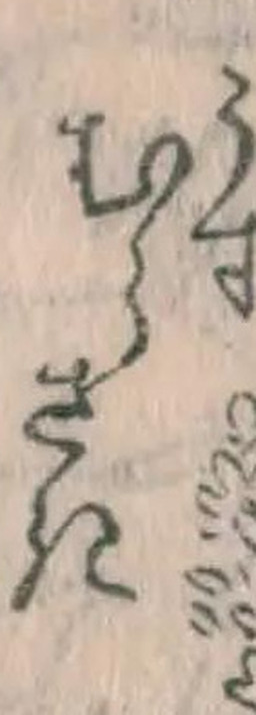むらさき
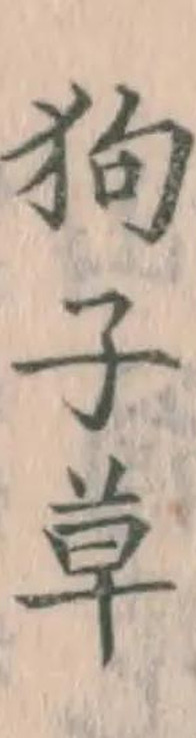狗子草
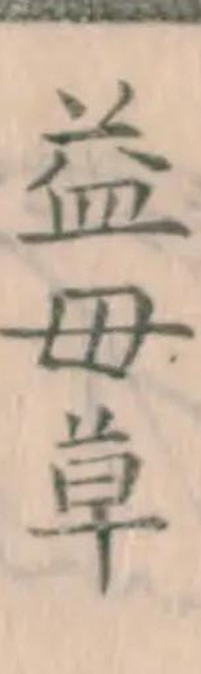益母草
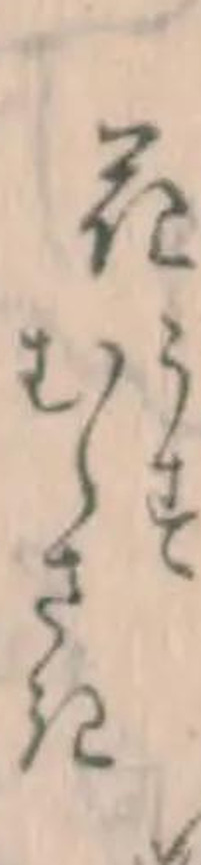むらさき
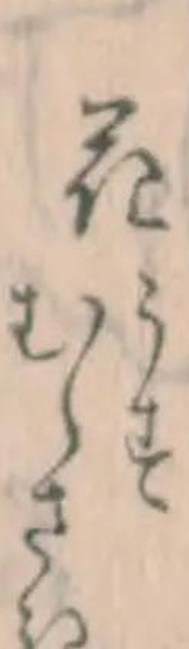花うす
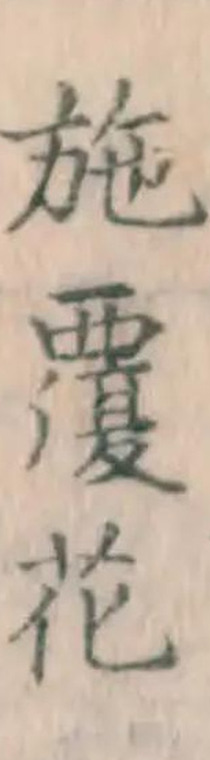旋覆花

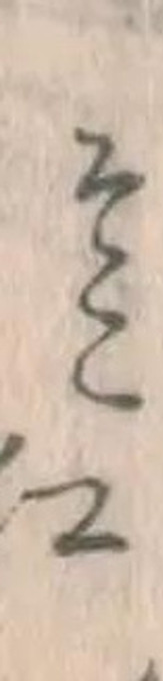そこ紅
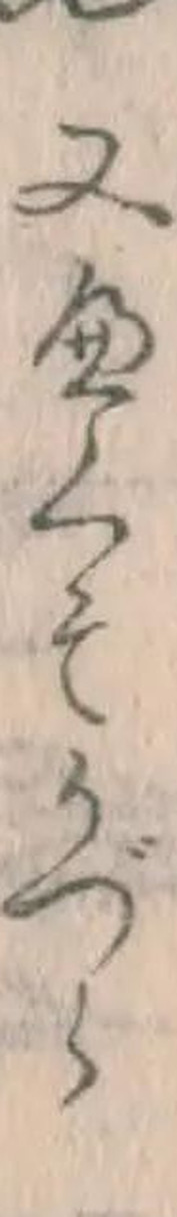又へくそかづら
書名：誹諧名知折 2巻. [2]
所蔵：国立国会図書館 National Diet Library, JAPAN
